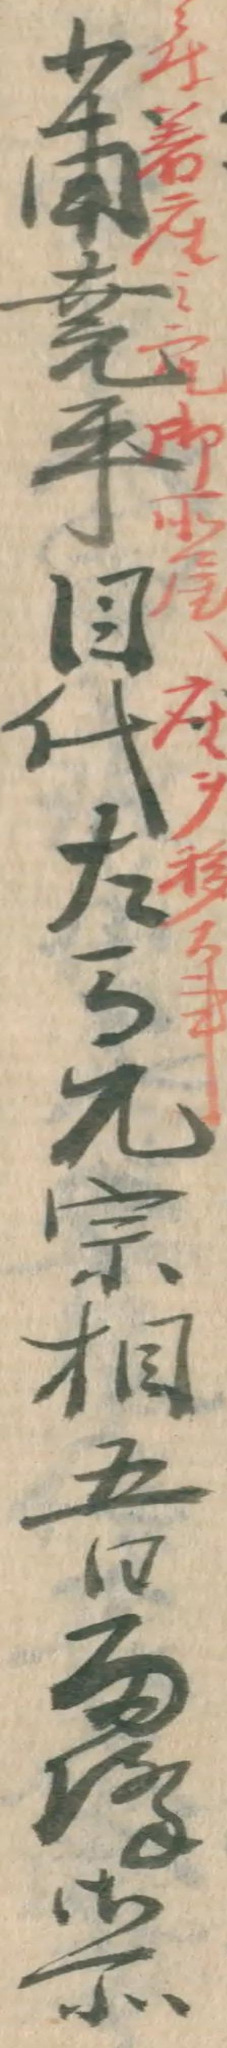少輔堯平目代左馬允宗相五日雨降御所
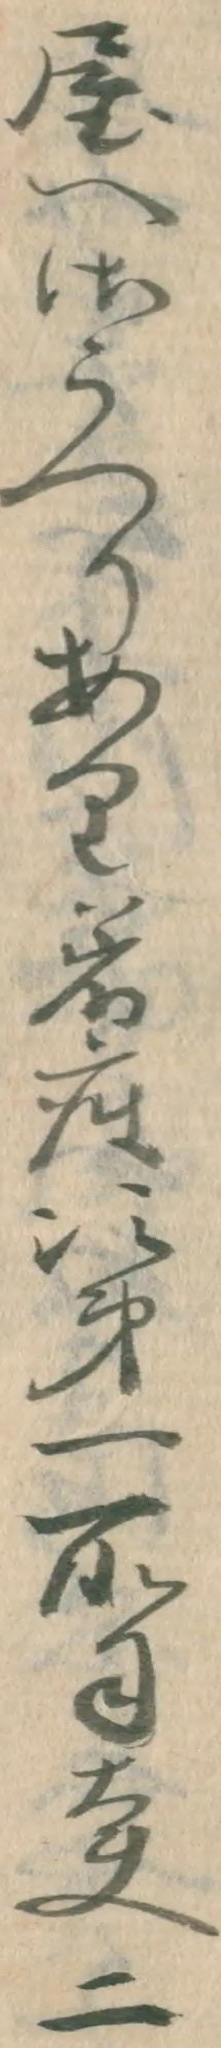屋へ御うつりあり着座次第一所司大夫二
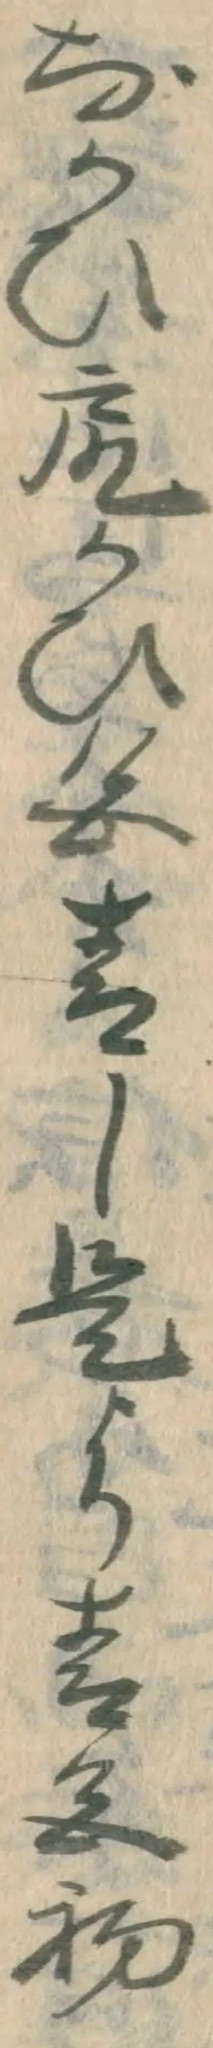なかひ尻かひ色青し是より青色初
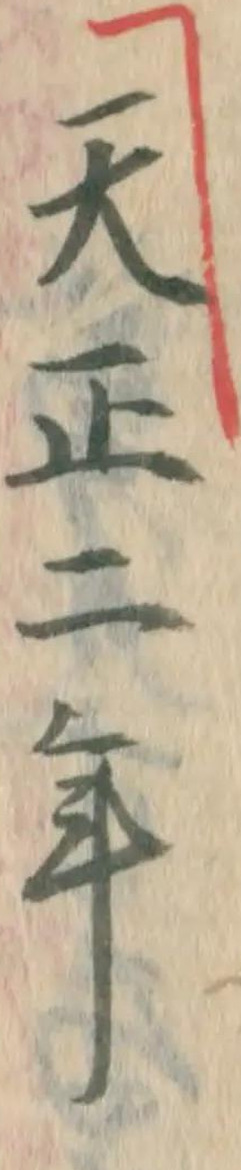天正二年

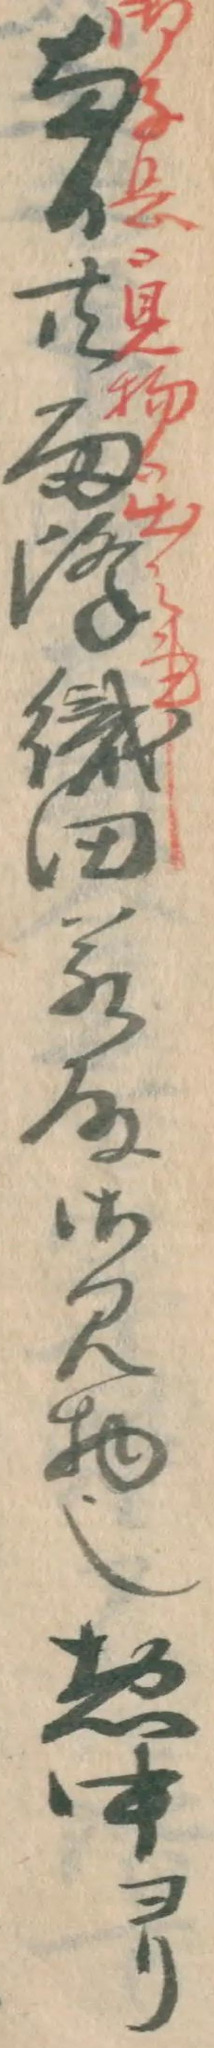両日共雨降織田若殿御見物也惣中ヨリ
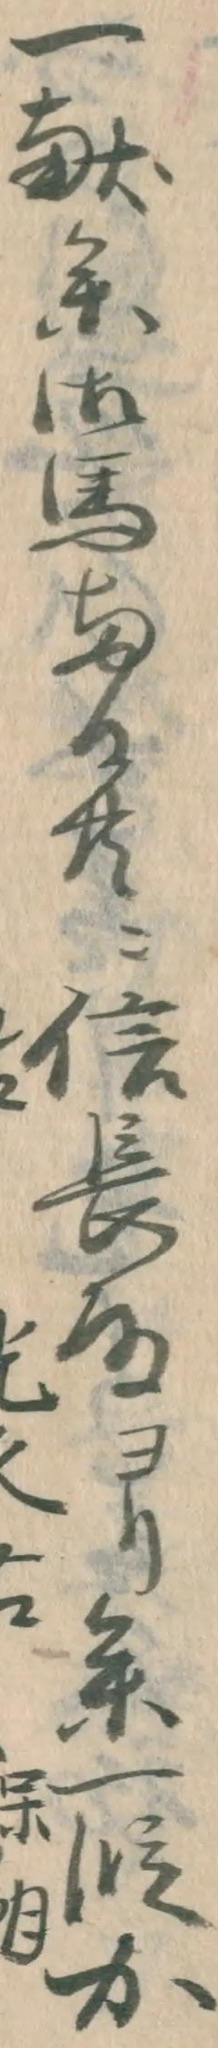一献参御馬両日共ニ信長殿ヨリ参一段加
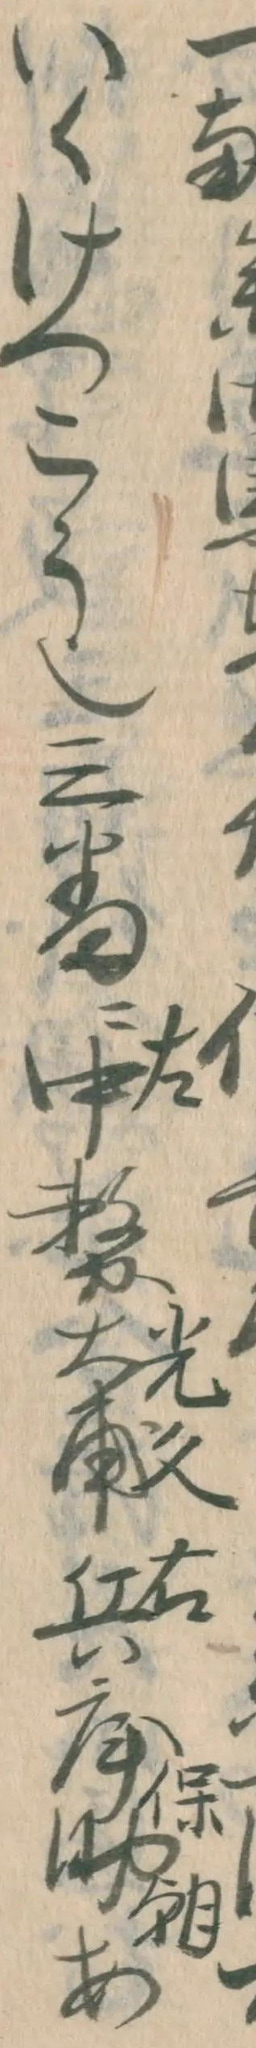いくけつこう也三番ニ中務大輔兵庫助あ
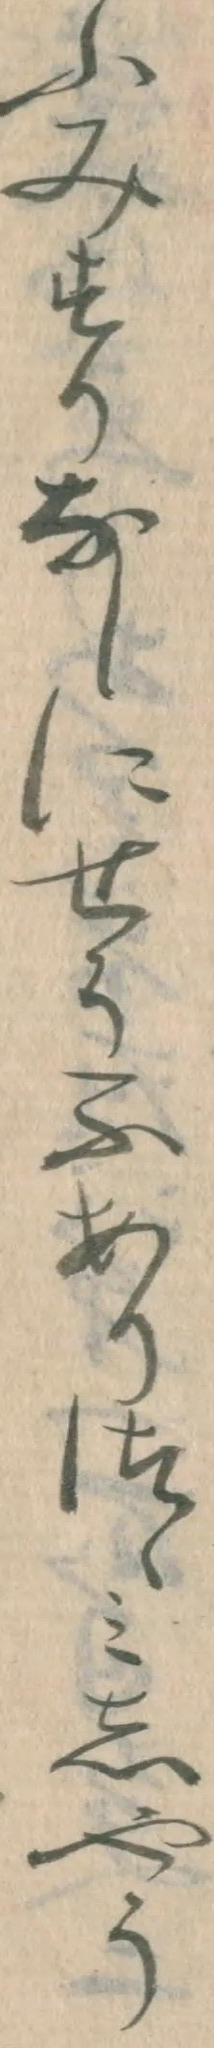ふみすりなしにせうふありつゝみしやう
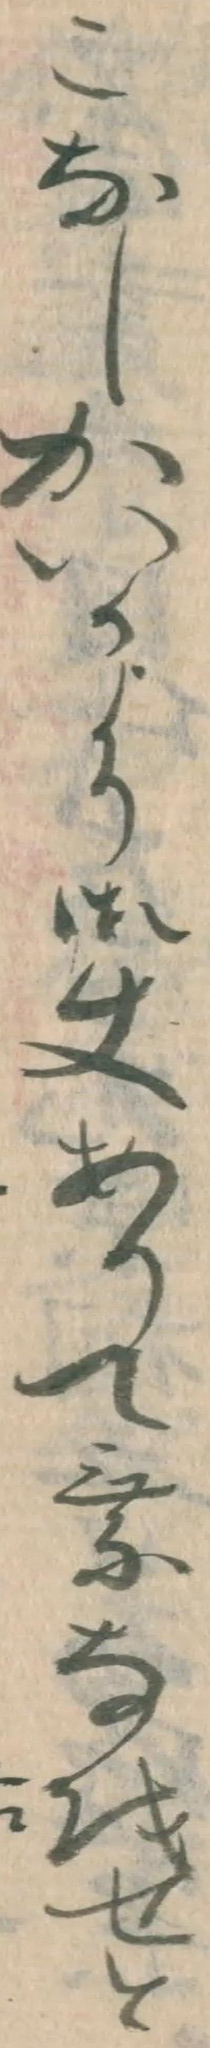こなしかいかより御使ありて乗なをせと
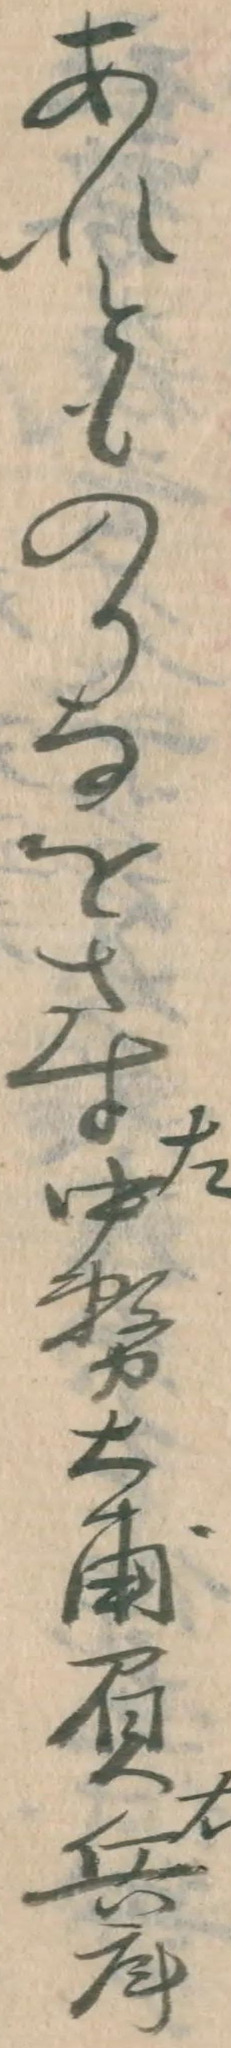あれとものりなをさす中務大輔負兵庫
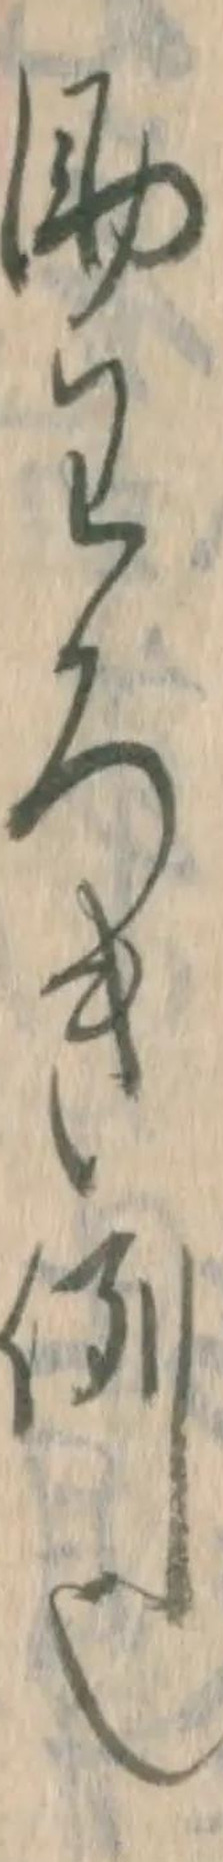助わろき例也
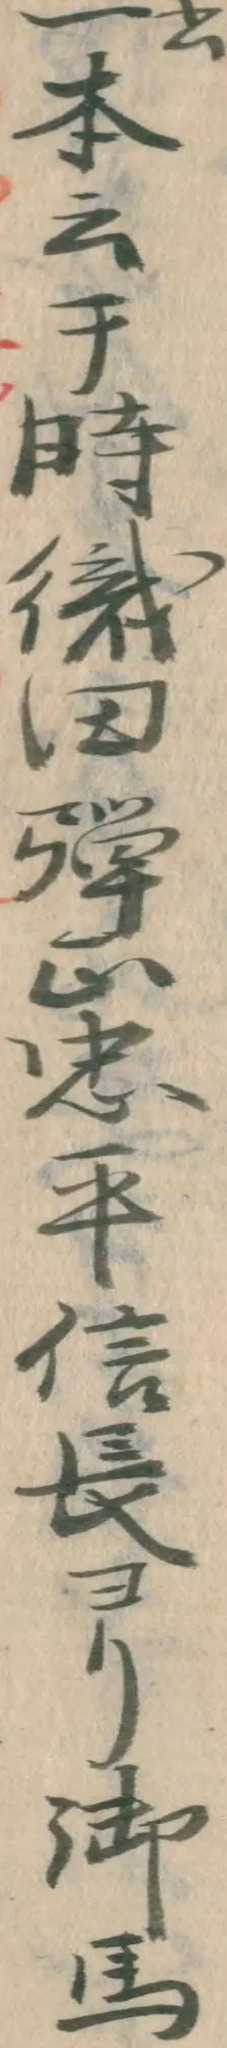一本云于時織田弾正忠平信長ヨリ御馬
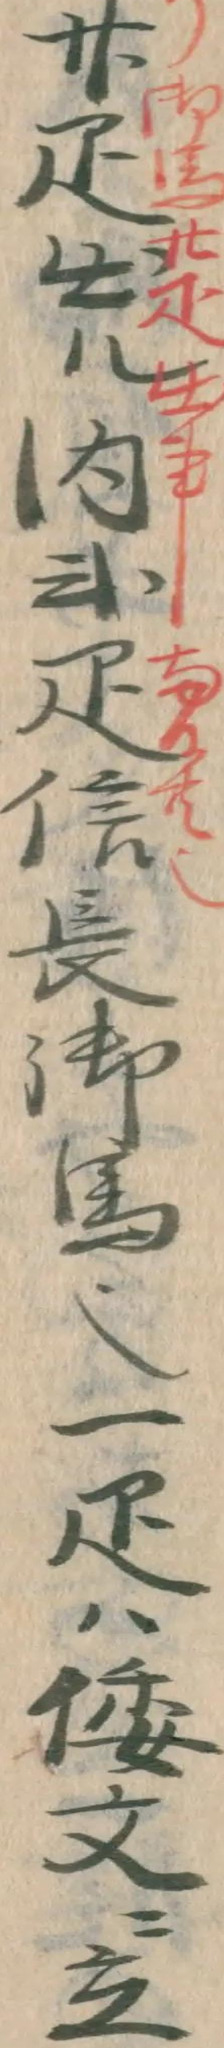廿疋出ル内弐疋信長御馬也一疋ハ倭文ニ立
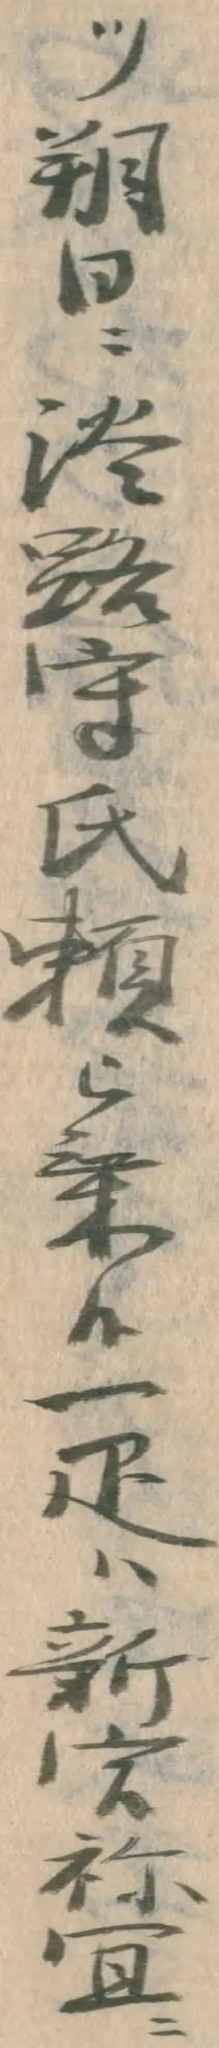ツ朔日ニ淡路守氏頼被乗候一疋ハ新宮祢宜ニ
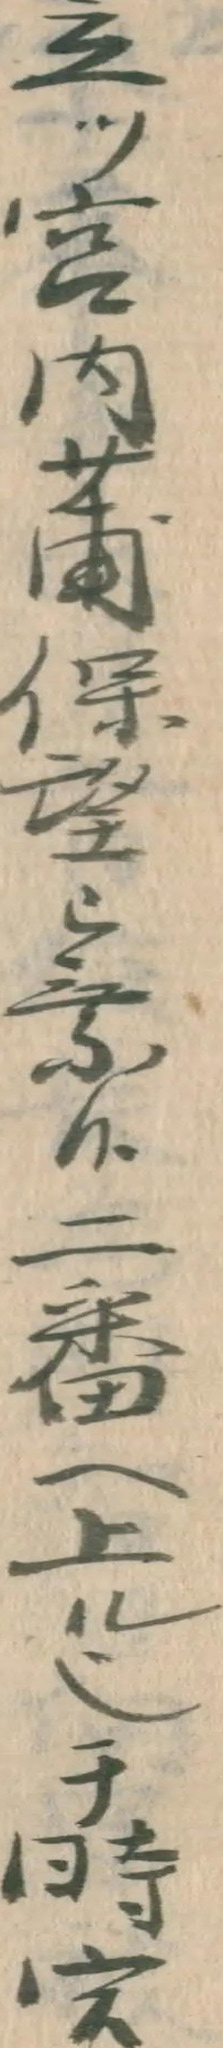立ツ宮内少輔保望被乗候二番へ上ル也于時宮
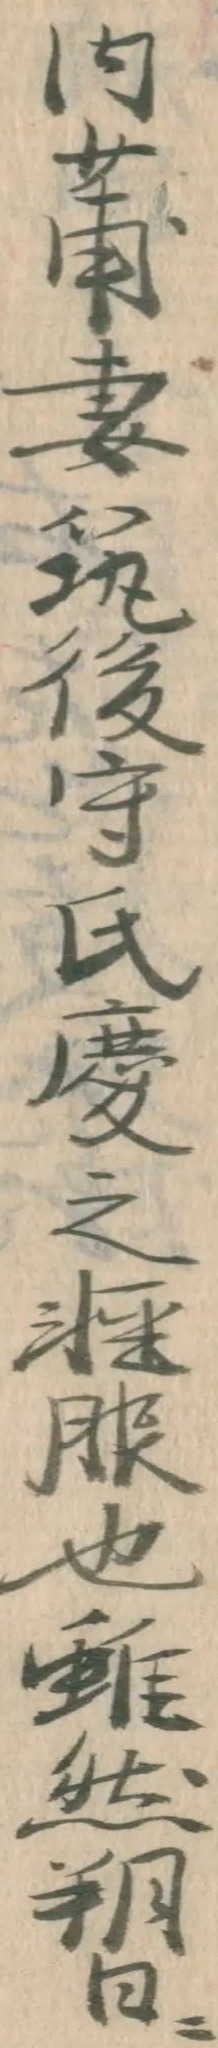内少輔妻筑後守氏慶之軽服也雖然朔日ニ
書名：賀茂社記録. 第10冊
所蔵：国立国会図書館 National Diet Library, JAPAN
